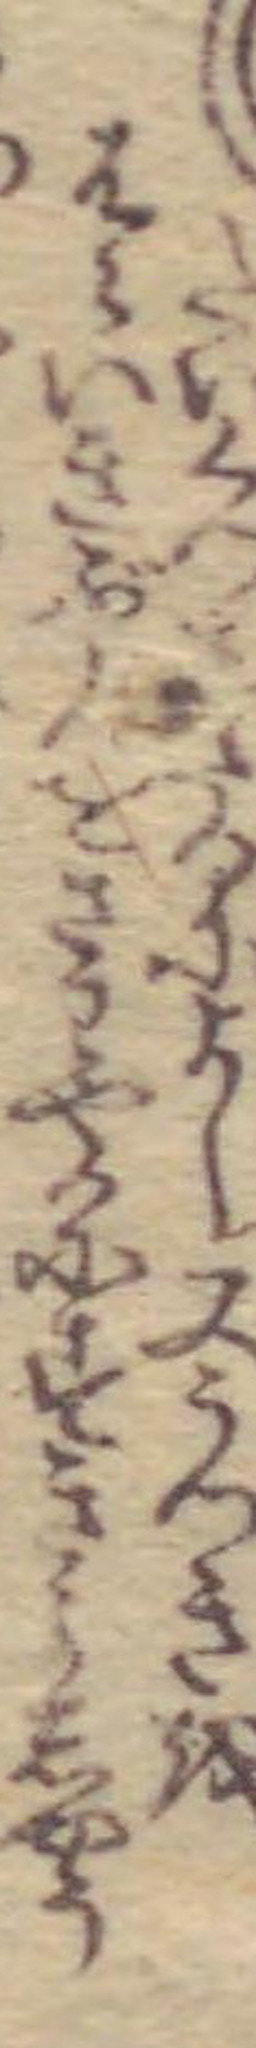はらいきぶんをさわやかにすきにしやう
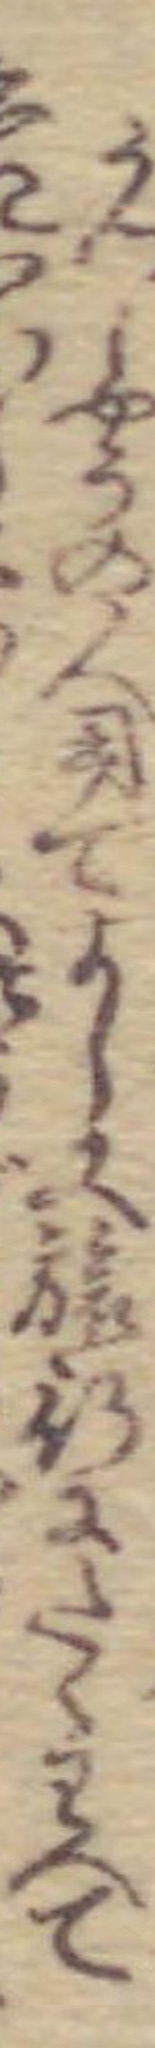うつしやうの人用てよし又旅行にたくわへて
